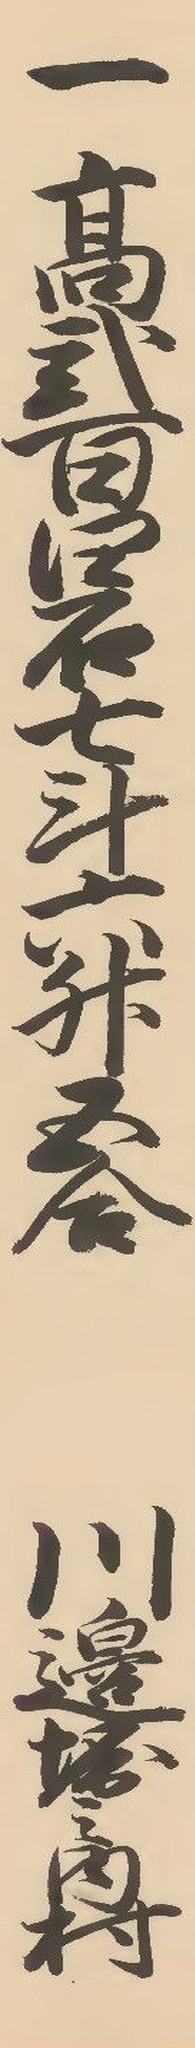一高弐百四石七斗六升五合川邉堀之内村
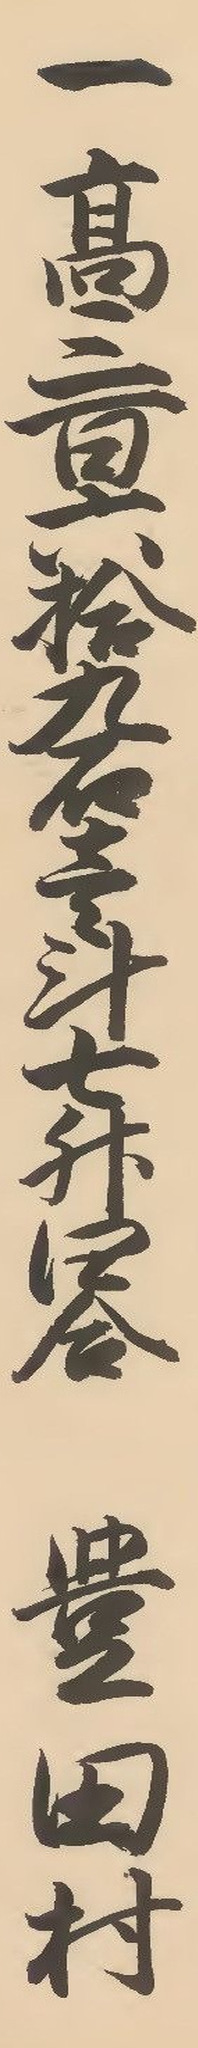一高三百六拾九石壱斗七升四合豊田村
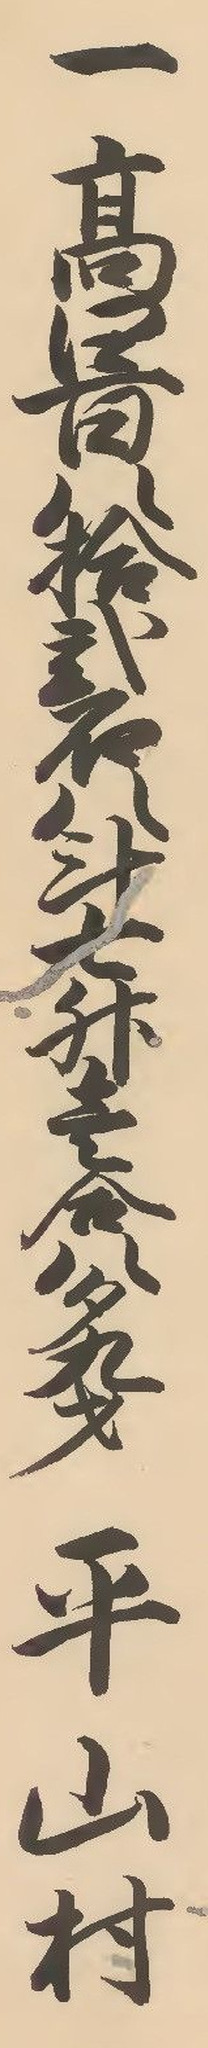一高四百八拾弐石八斗七升壱合八勺九才平山村

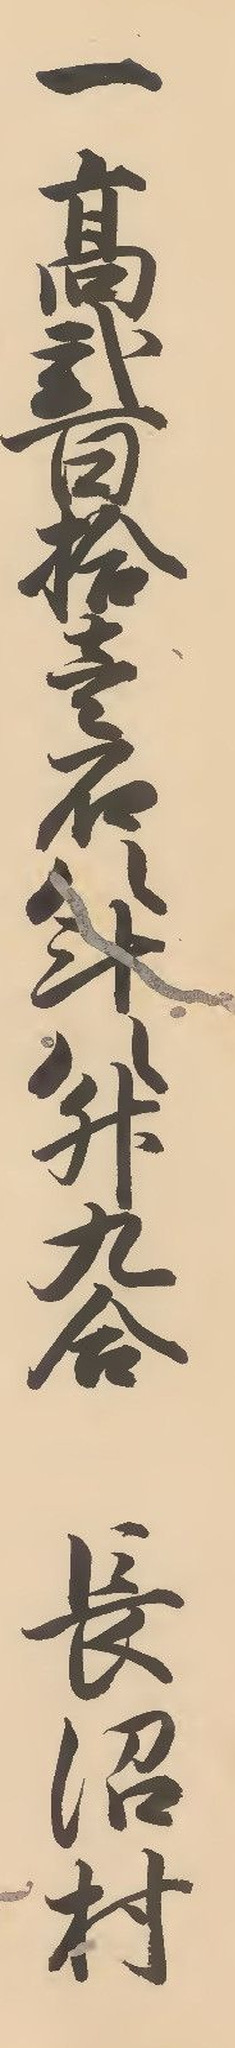一高弐百拾壱石八斗八升九合長沼村
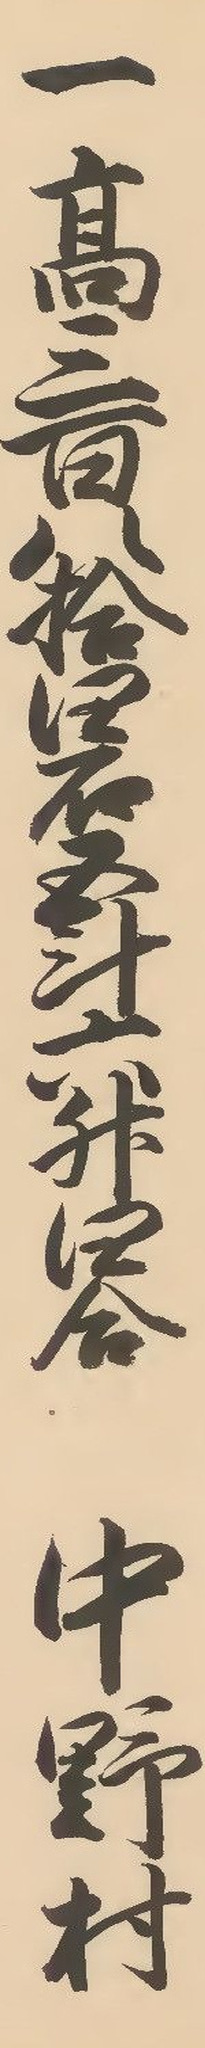一高三百八拾四石五斗六升四合中野村
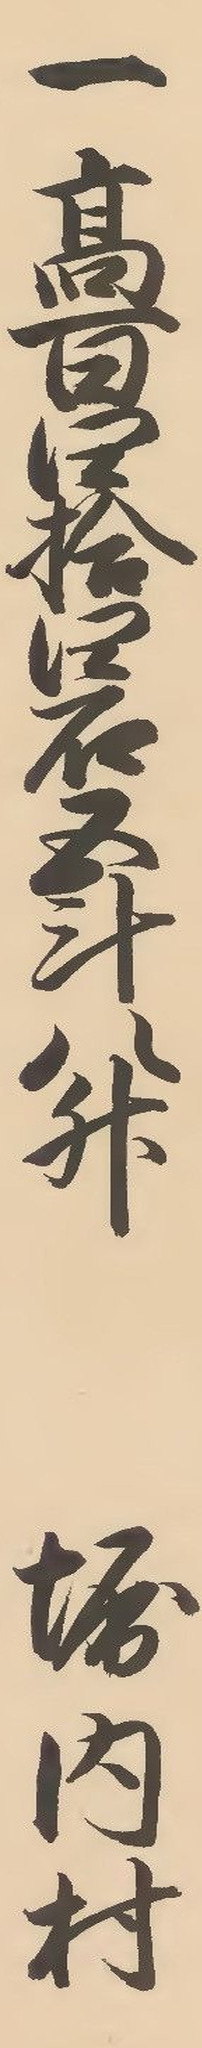一高百四拾四石五斗八升堀内村
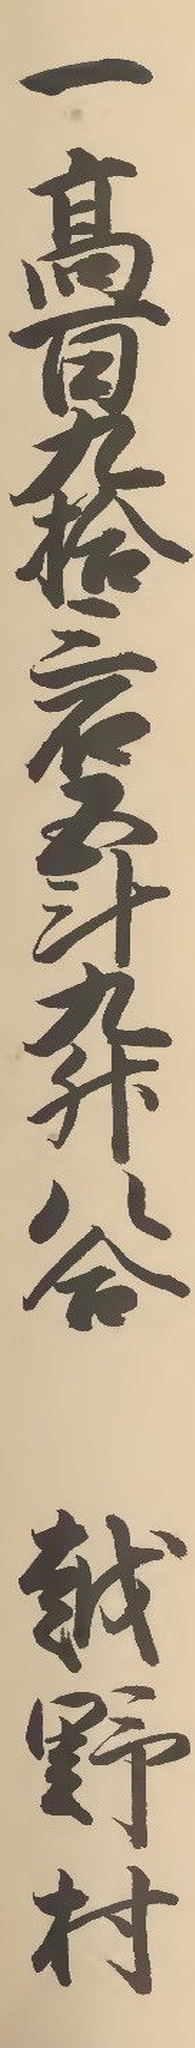一高百九拾三石五斗九升八合越野村
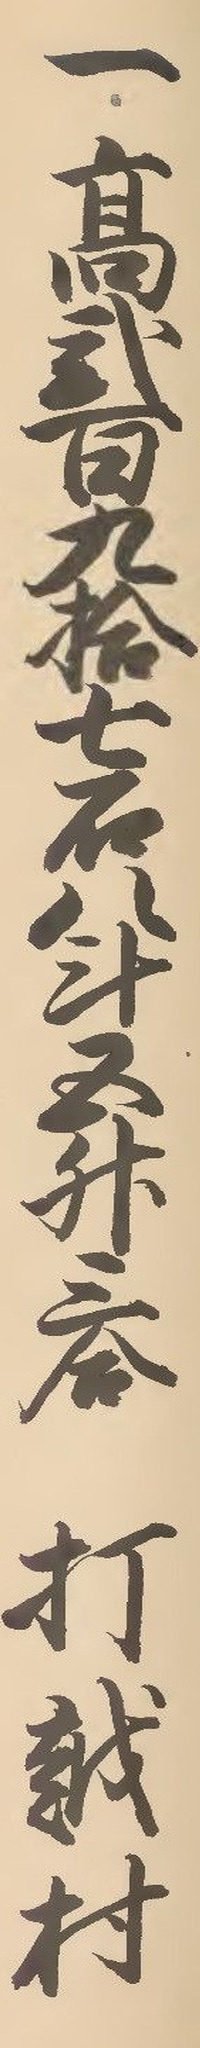一高弐百九拾七石八斗五升三合打越村
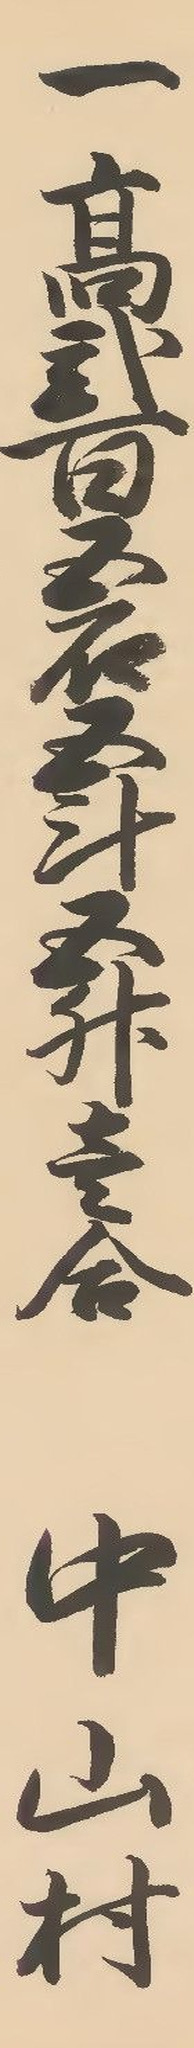一高弐百五石五斗五升壱合中山村
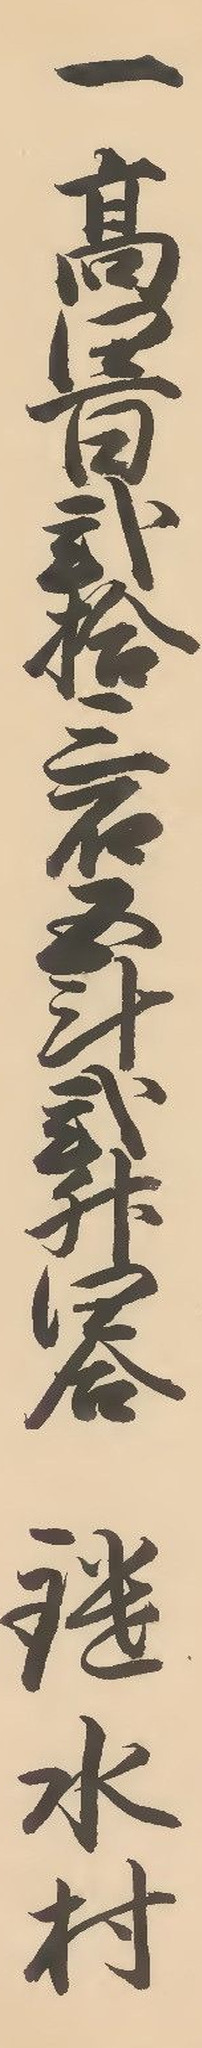一高四百弐拾三石五斗弐升四合鑓水村
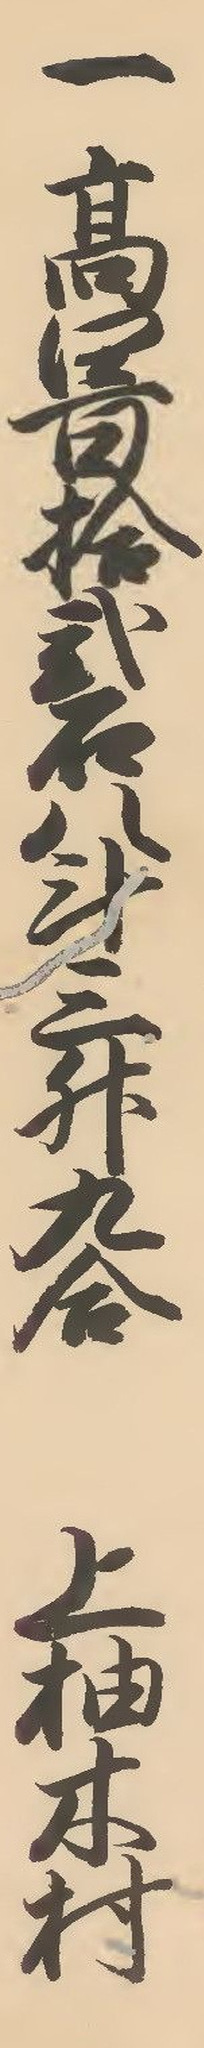一高四百拾弐石八斗三升九合上柚木村

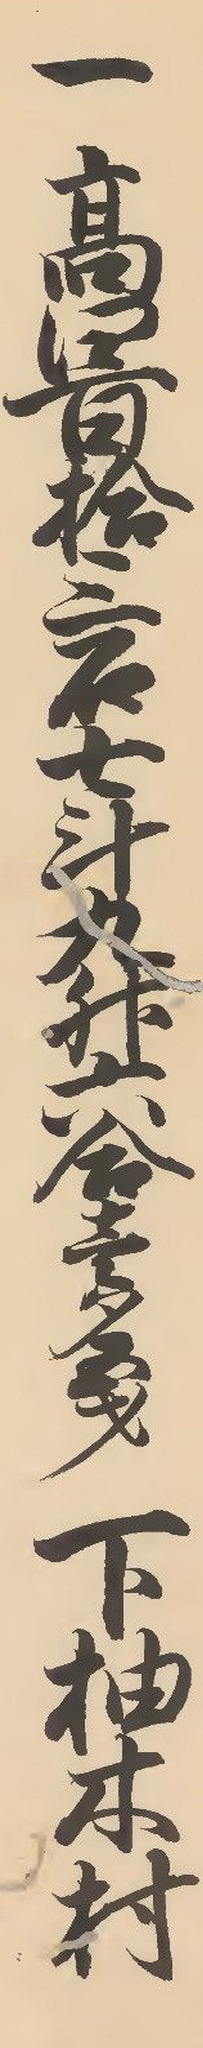一高四百拾三石七斗九升六合壱勺五才下柚木村
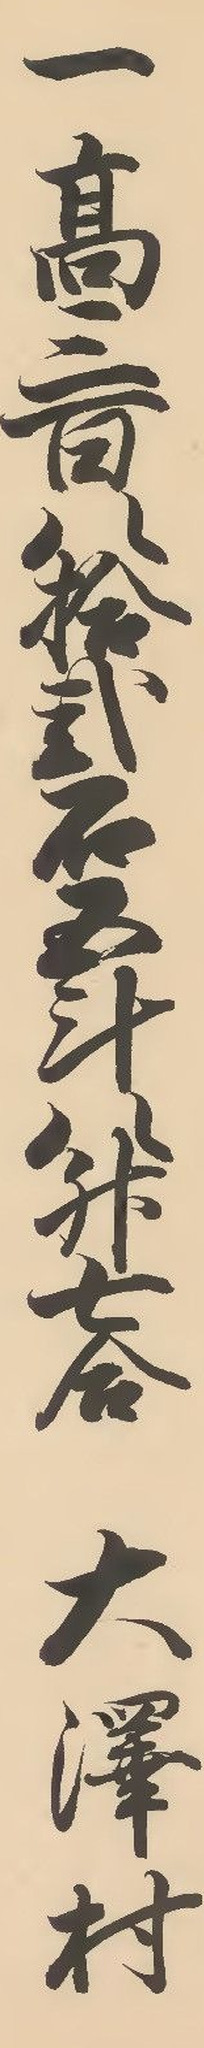一高三百八拾弐石五斗八升七合大澤村
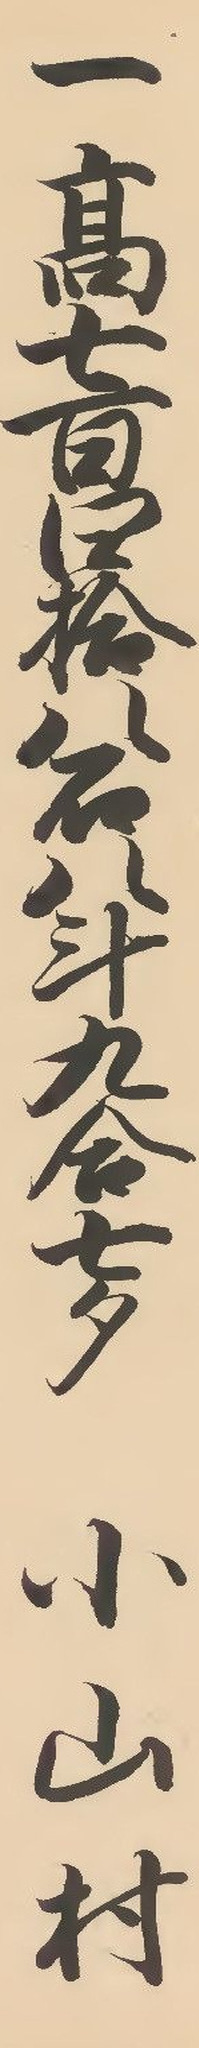一高七百四拾八石八斗九合七勺小山村
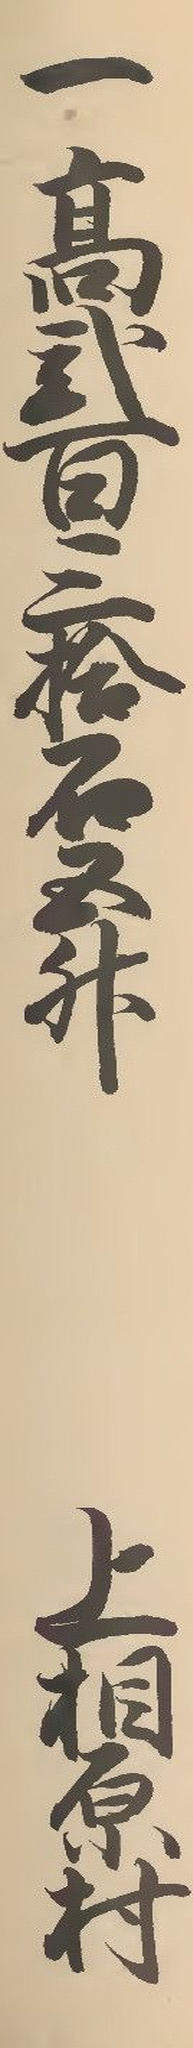一高弐百三拾石五升上相原村
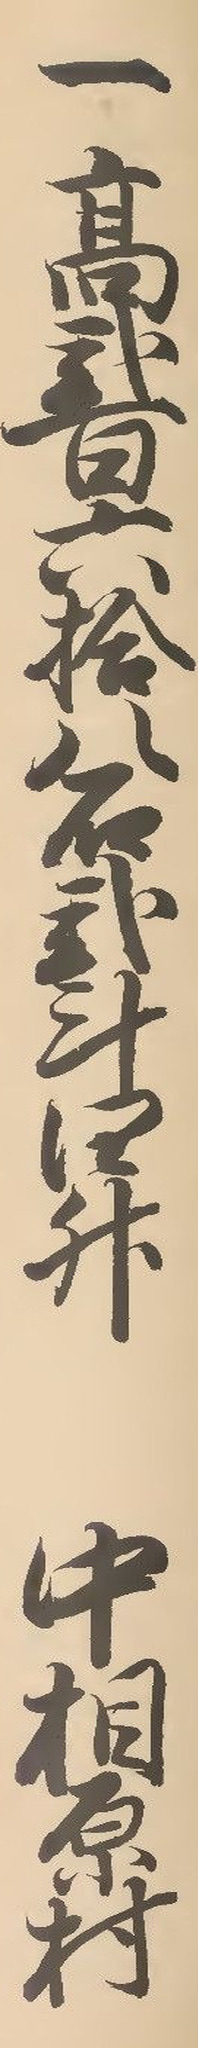一高弐百六拾八石弐斗四升中相原村
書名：武蔵国郷帳　上
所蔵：国立公文書館 National Archives of Japan
